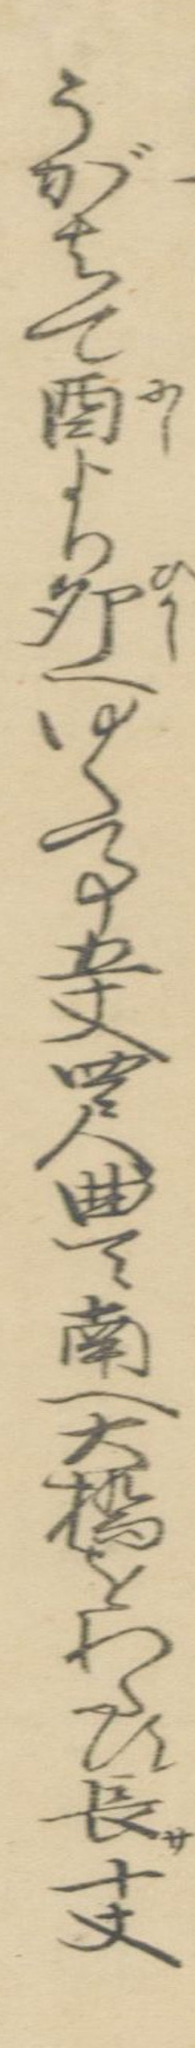うがちて西より外へいたる事五丈四尺曲て南へ大橋をわたす長サ十丈
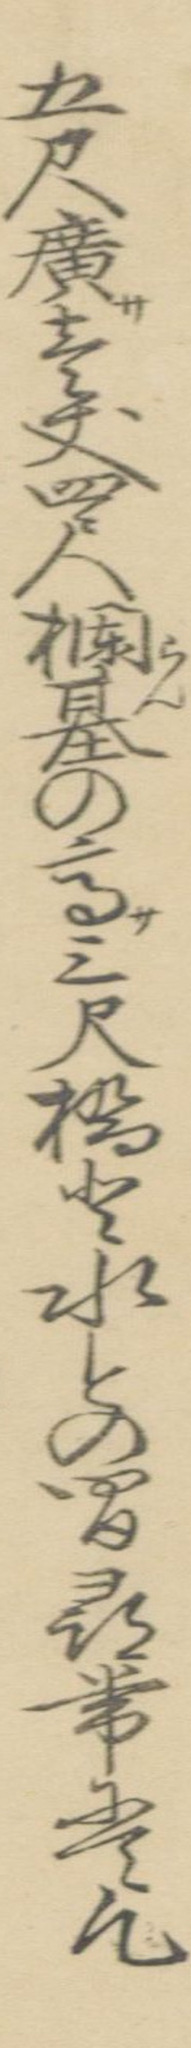五尺廣サ壱丈四尺欄基の高サ三尺橋と水との間尋常にて凡
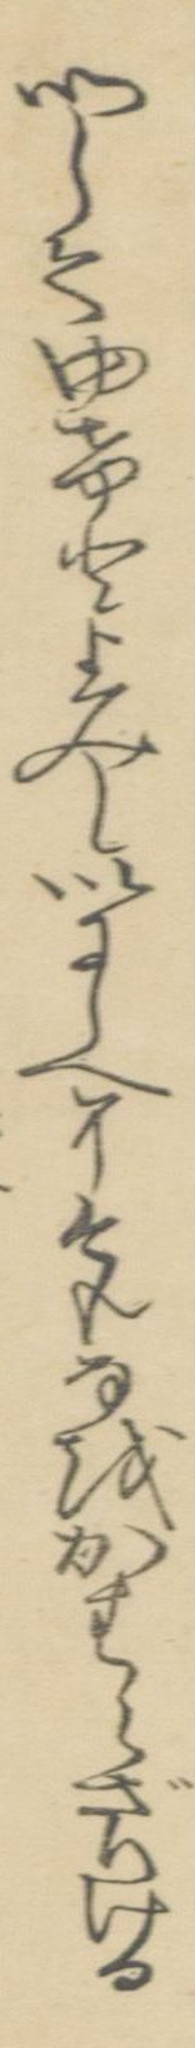心してゆけとよみしいにしへに今もなをかはらざりける
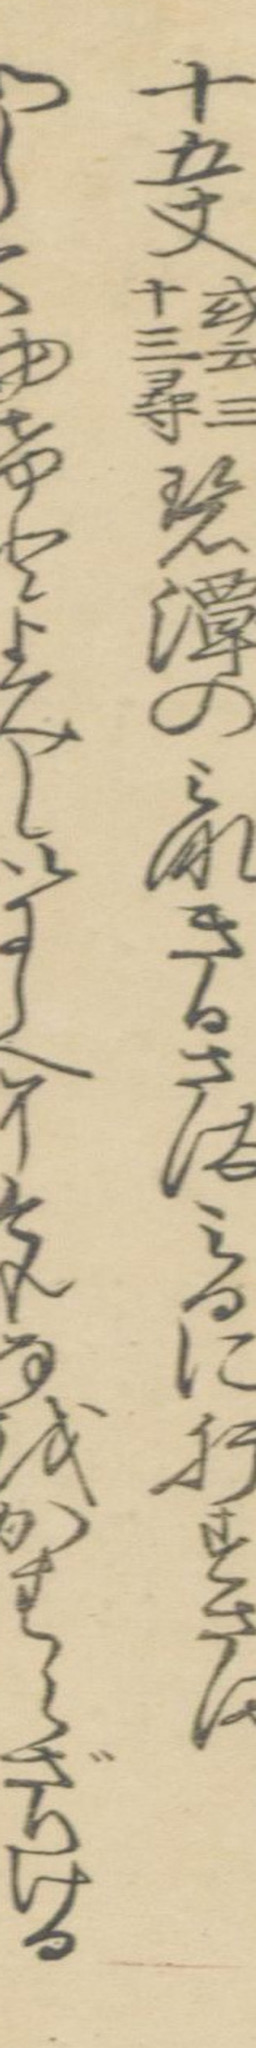心してゆけとよみしいにしへに今もなをかはらざりける
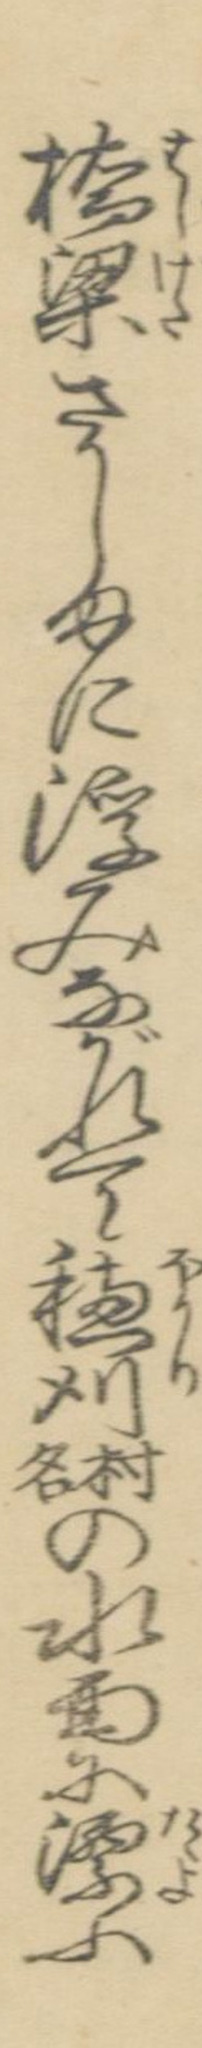橋梁さかしまに浮みながれて穂刈村名の水面に漂
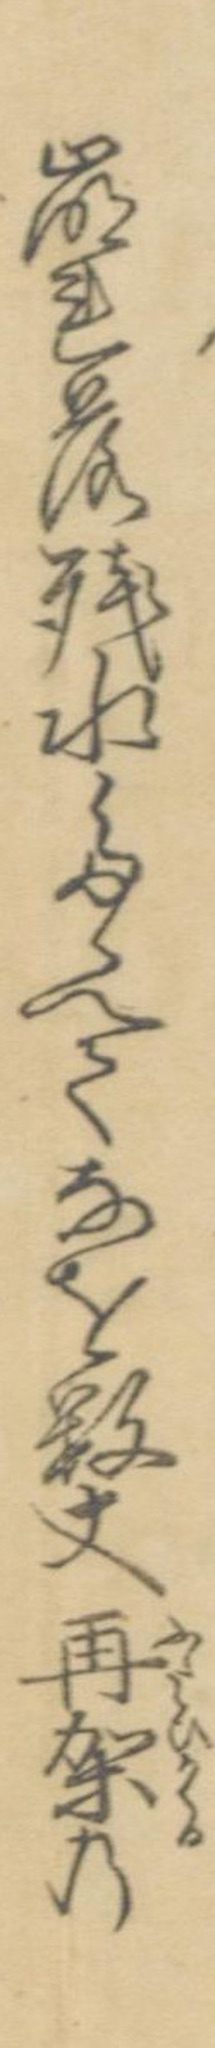崩れ落残水たゝへてなを数丈再架の
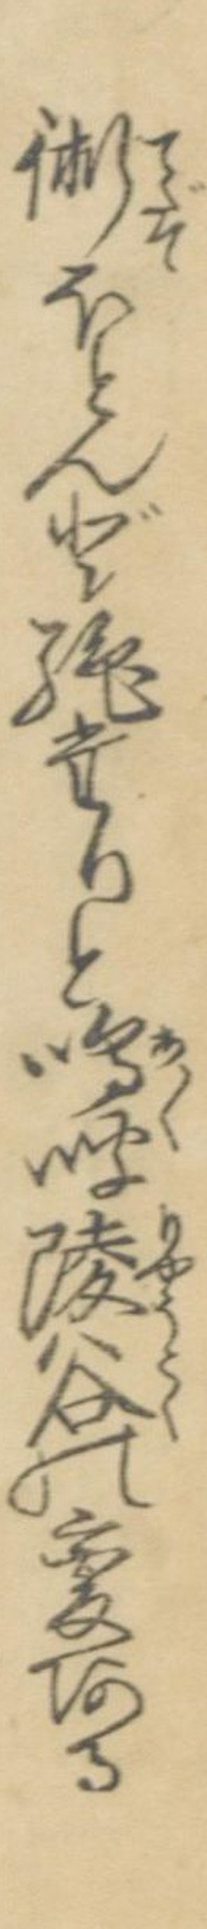術ほとんど絶たりと嗚呼陵谷の変なる
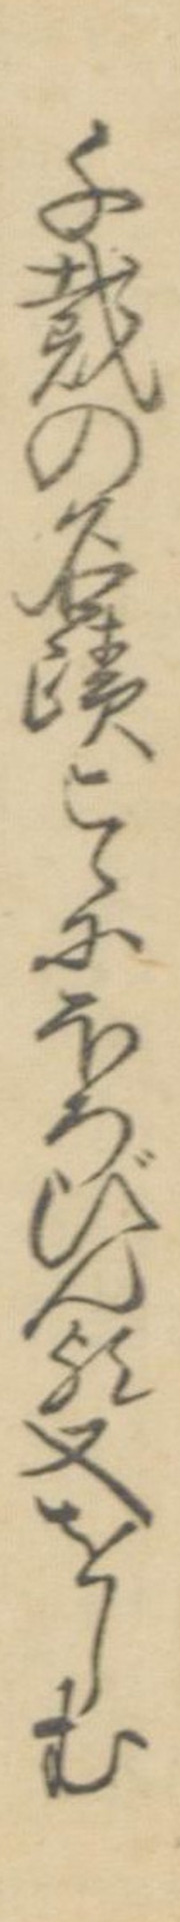千載の名蹟こゝにほろびん歟又をしむ
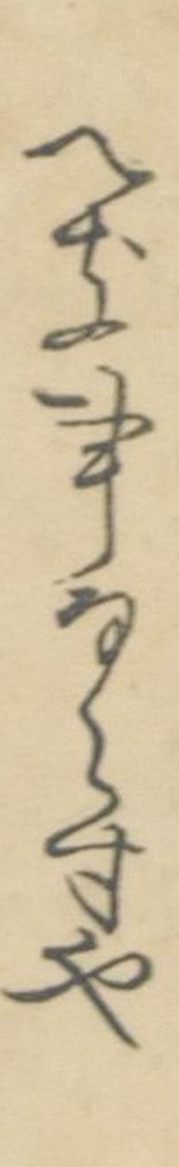へき事ならすや
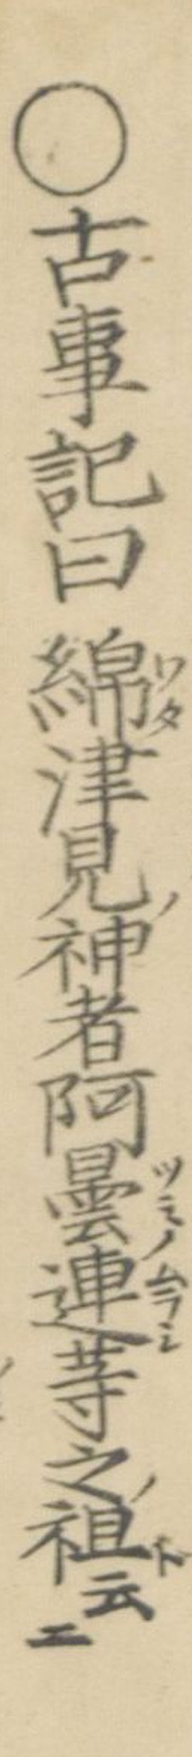◯古事記曰綿津見ノ神者阿曇連等之祖ト云
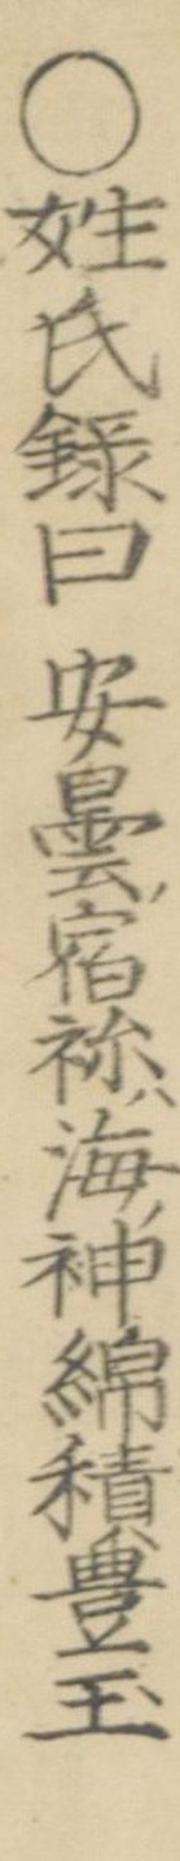◯姓氏録曰安曇ノ宿祢ハ海ノ神綿積豊玉
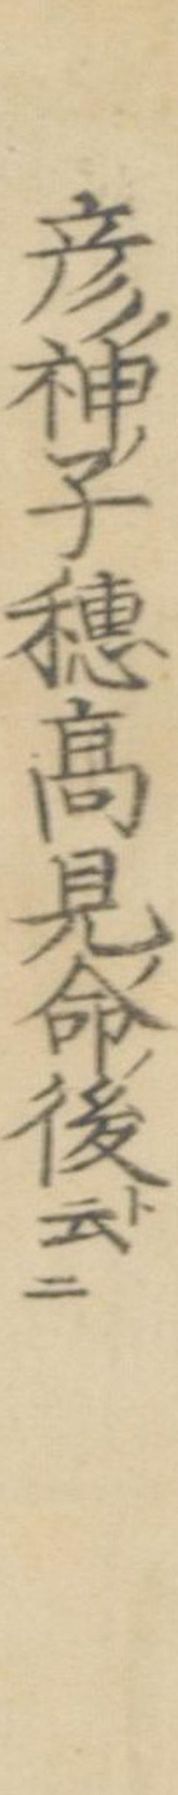彦神ノ子穂高見ノ命ノ後ㇳ云
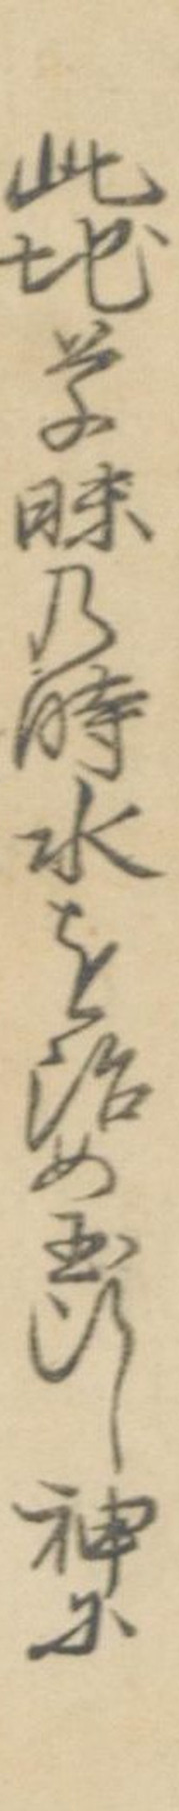此地草昧の時水を治め玉ひし神に
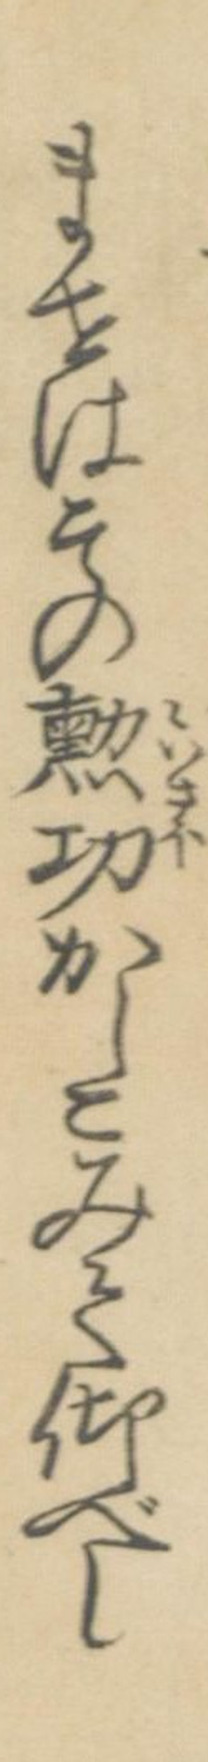ますはその勲功かしこみて仰べし
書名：丁未大震山頽湛水之圖　一鋪
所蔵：東京大学地震研究所図書室 Earthquake Research Institute Library, The University of Tokyo, JAPAN
